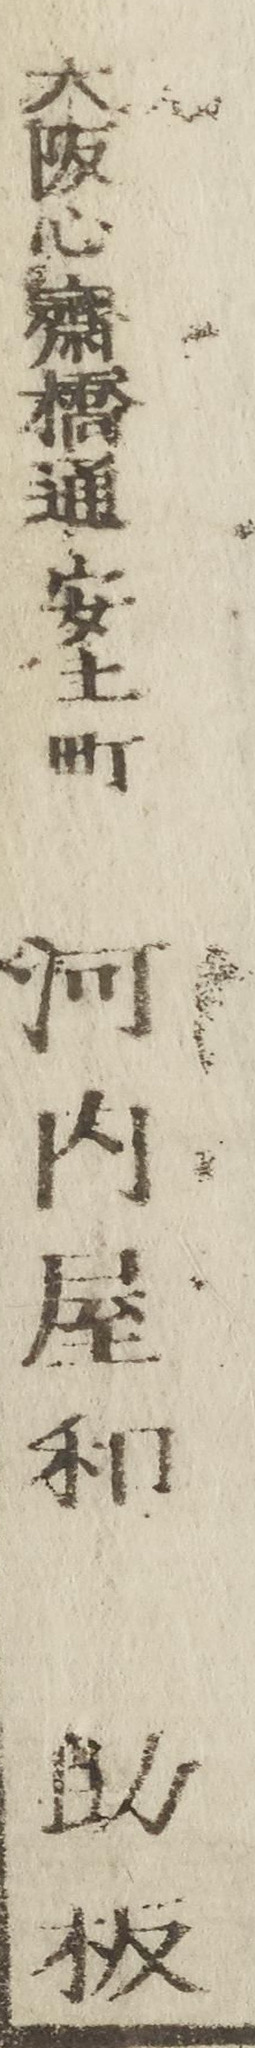大阪心斎橋通安土町河内屋和助板
